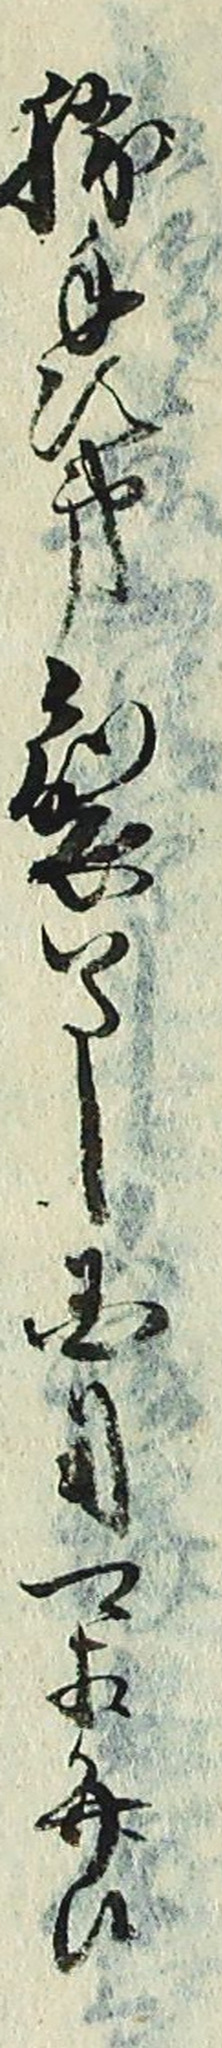勝手次第製いたし国用可相弁候
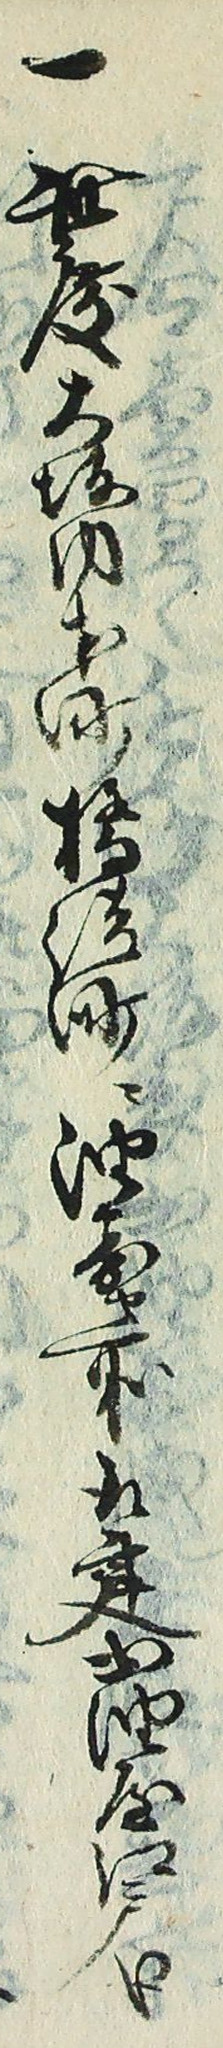一此度大坂内本町橋詰町に油寄せ所取建出油屋江戸口
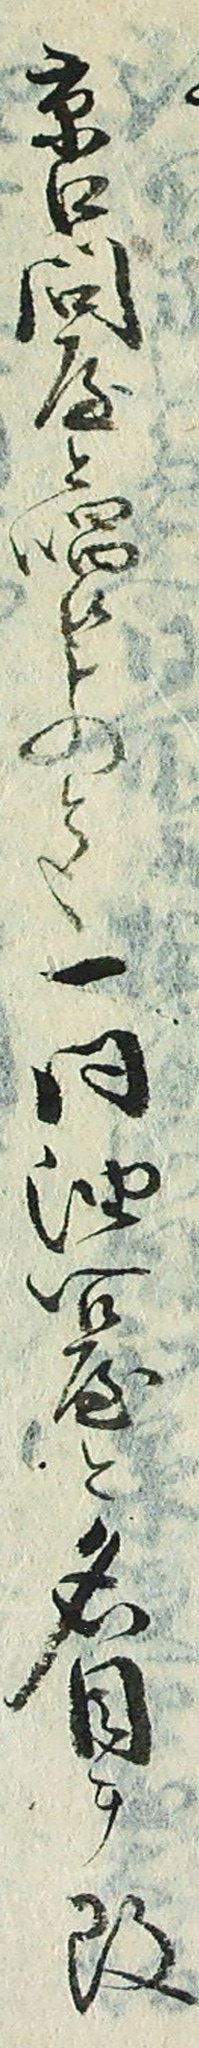京口問屋と唱候ものとも一同油問屋と名目を改
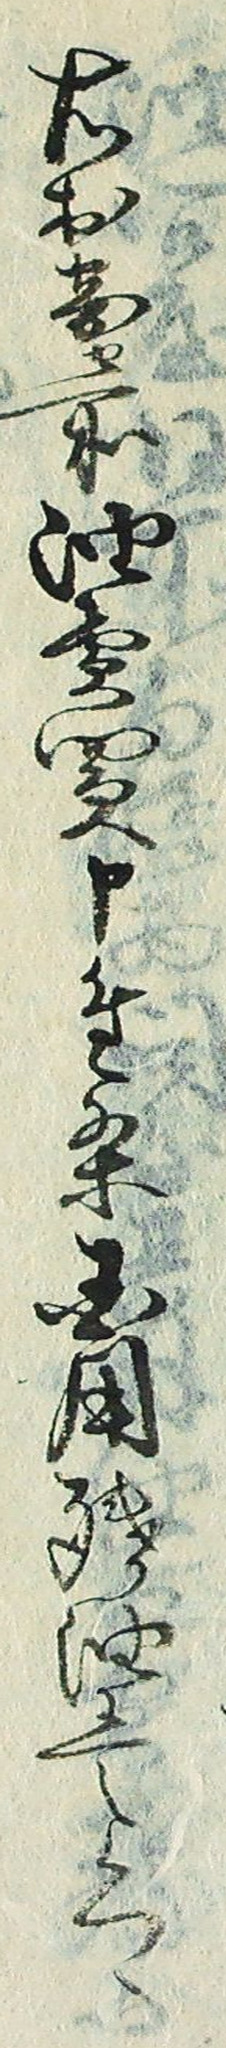右於寄せ所油売買申付候条国用残り油有之候はゝ
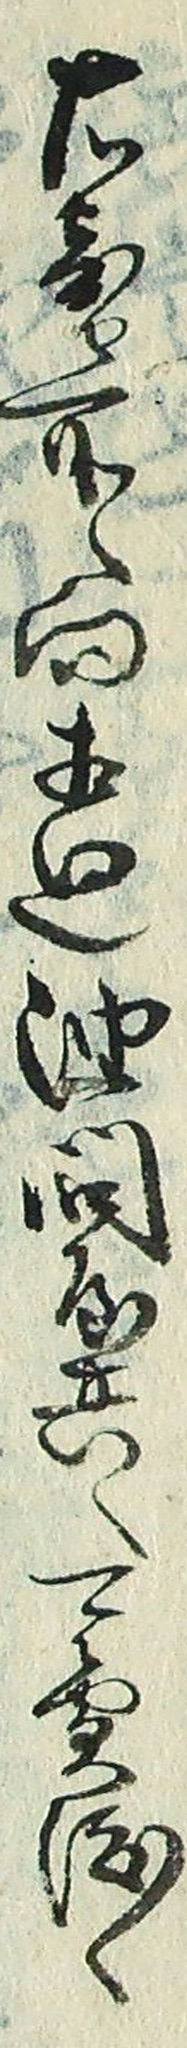右寄せ所へ向相廻油問屋共へ可売渡候
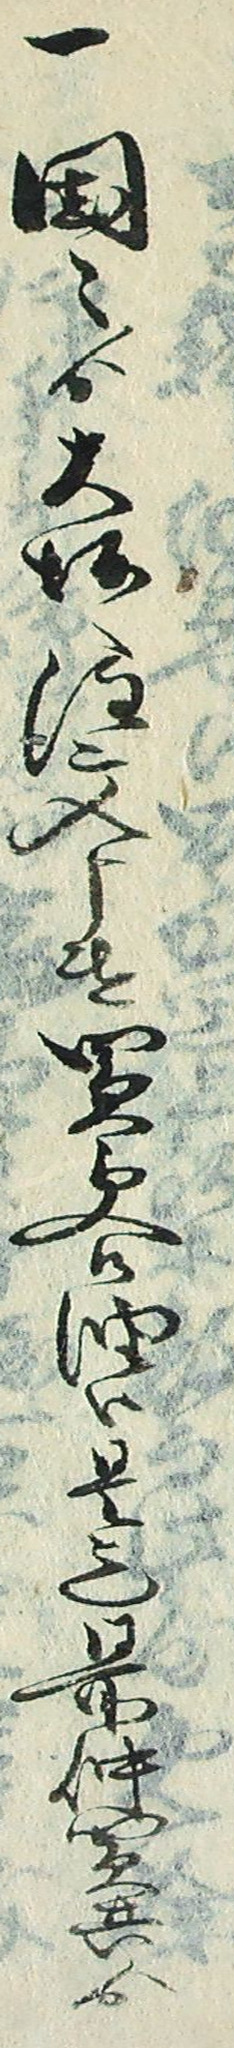一国々ゟ大坂へ注文申遣買受候油は是迄同所仲買共ゟ
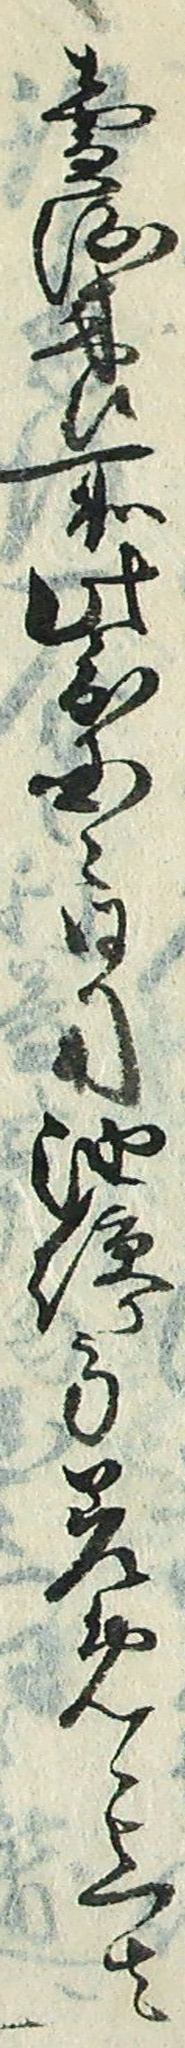売渡来候所此度国々日用油絞り方差免候上者
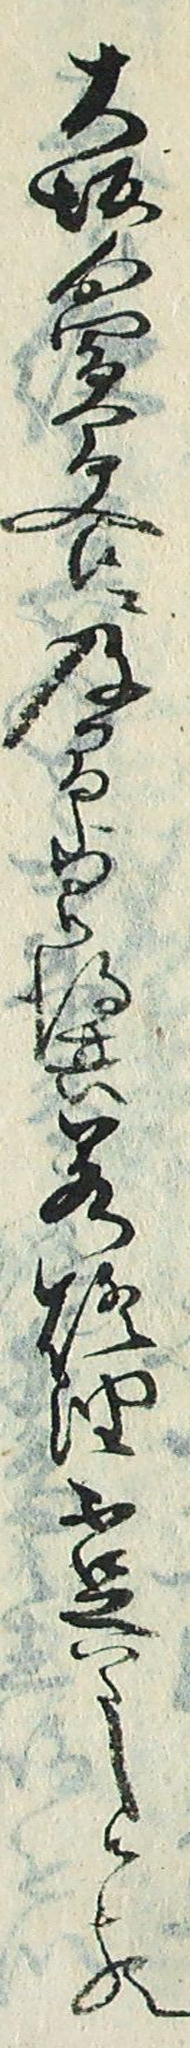大坂ゟ買受候に及間布候得共若燈油不足いたし候欤

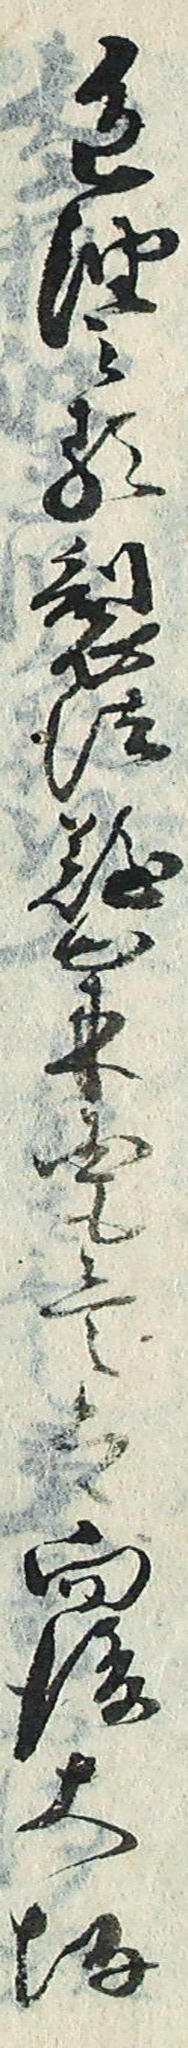色油之類製法難出来国も有之候はゝ向後大坂
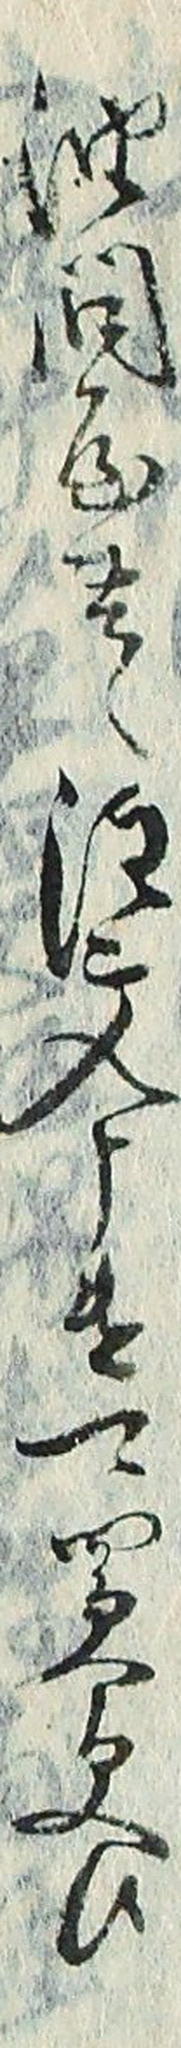油問屋共へ注文申遣可買受候
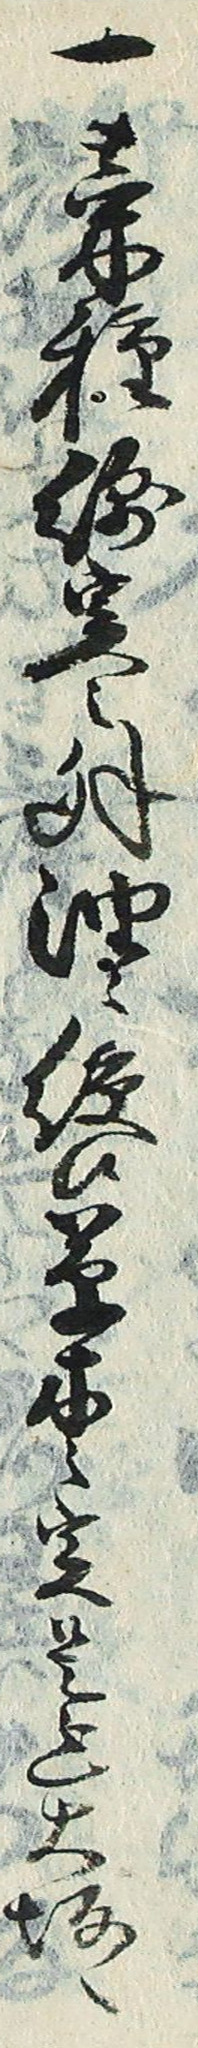一菜種綿実之外油に絞候草木之実是迄大坂へ
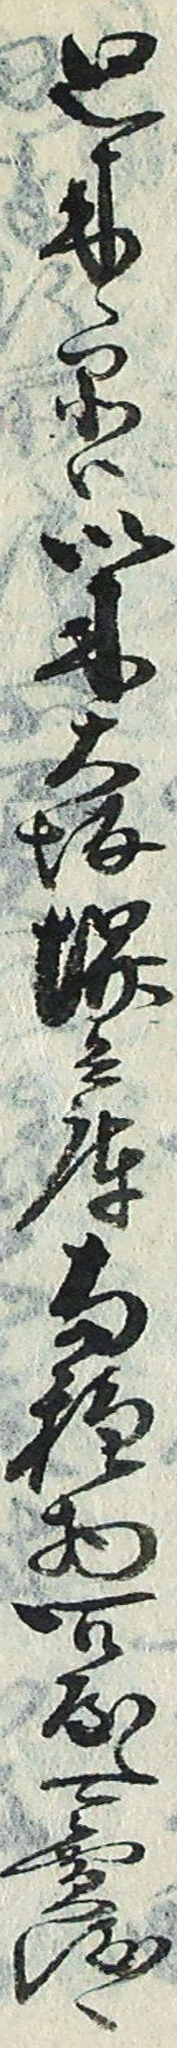廻来候品は以来大坂堺兵庫両種物問屋へ可売渡候
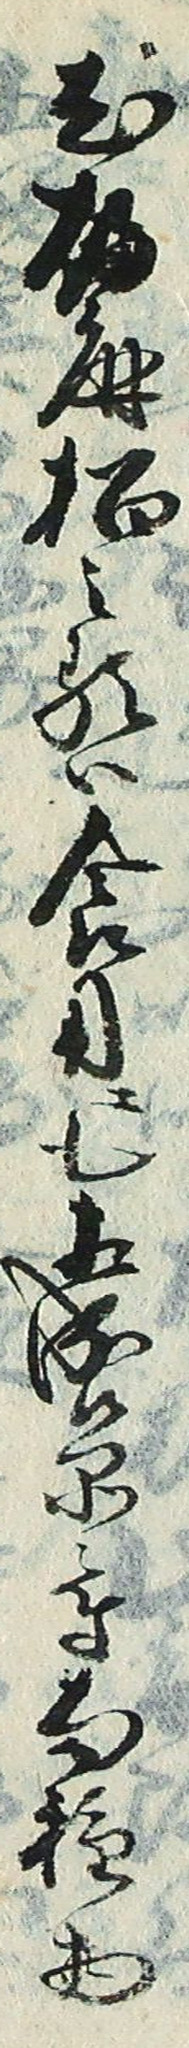尤胡麻粕之類は食用にも相成候品に付両種物
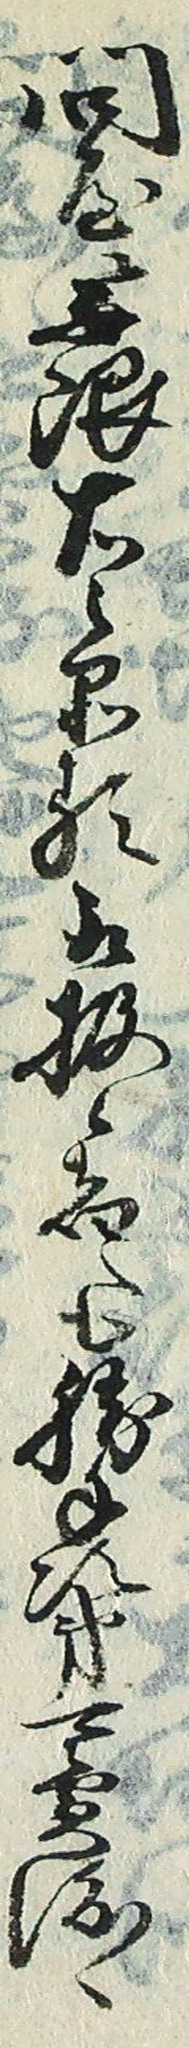問屋に不限右之品類取扱候者へも勝手次第可売渡候
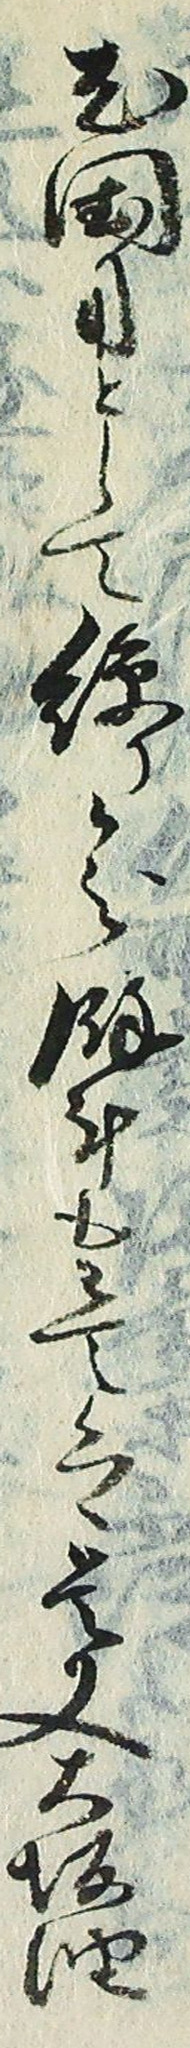尤国用として絞り候分余計も有之候はゝ是又大坂油
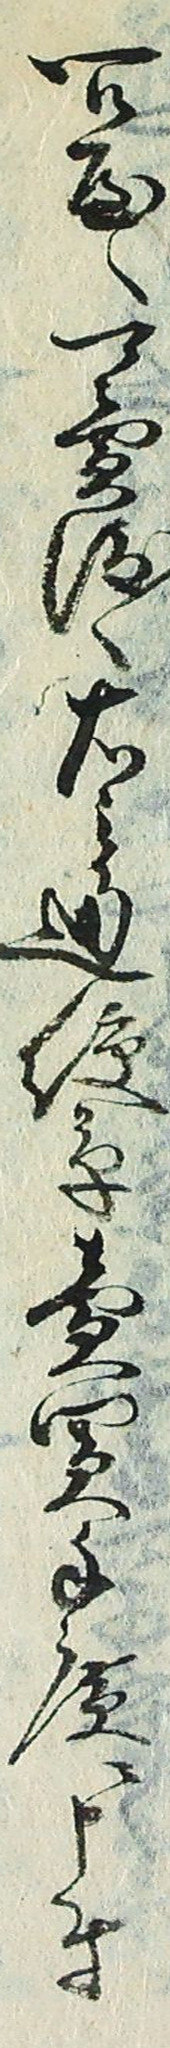問屋へ可売渡候右之通絞草売買手広に申付
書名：油稼御取究ニ附御箇條書テ以被仰渡南北同役申談御答書控
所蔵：鳴門教育大学 Naruto University of Education
